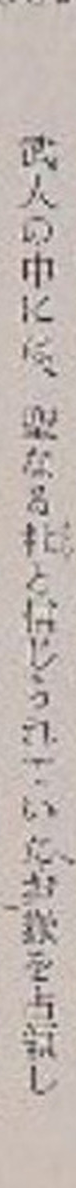武人の中には、聖なる杜と信じられていたお嶽を占領し
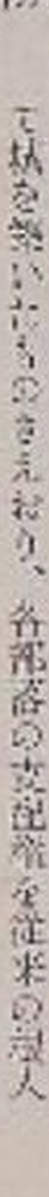て城を築いたものさえおり、各部落の支配権を従来の根人
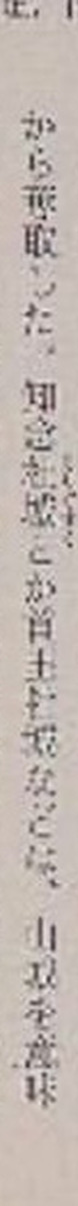から奪取した。知念杜城とか首里杜城などは、山城を意味
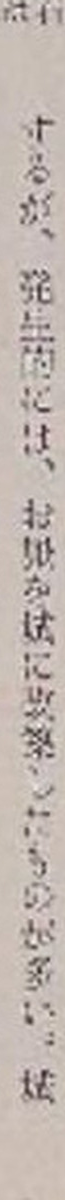するが、発生的には、お嶽を城に改築したものが多い。城
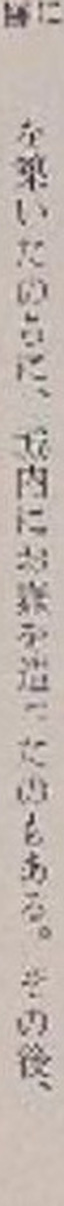を築いたのちに、城内にお嶽を造ったのもある。その後、
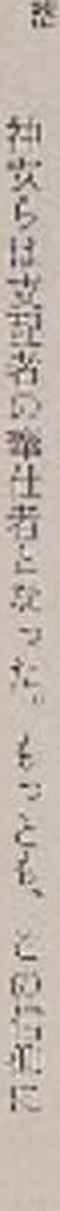神女らは支配者の奉仕者となった。もっとも、この信仰に
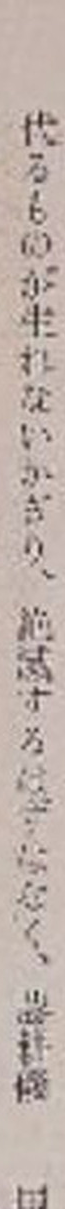代るものが生れないかぎり、絶滅するはずはなく、農耕儀
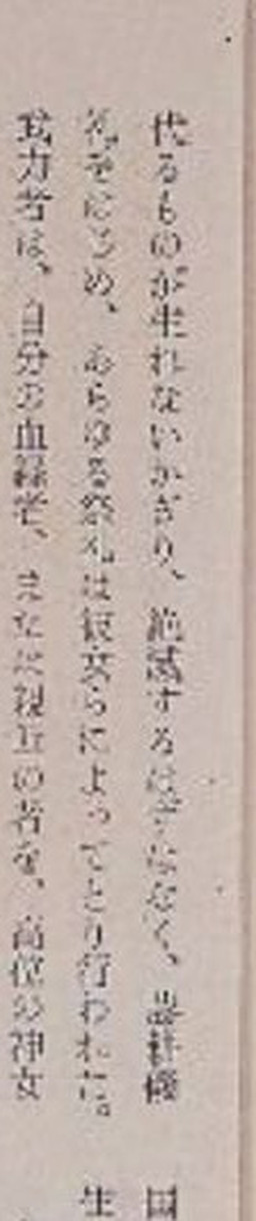礼をはじめ、あらゆる祭礼は彼女らによってとり行われた。
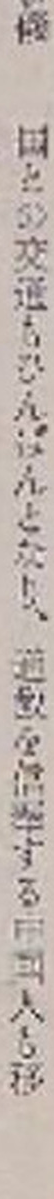国との交通もひんぱんとなり、道教を信奉する中国人も移
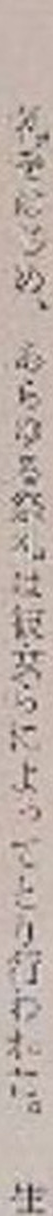礼をはじめ、あらゆる祭礼は彼女らによってとり行われた。
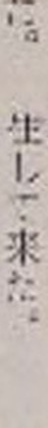住して来た。
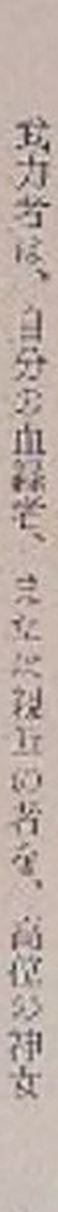武力者は、自分の血縁者、または親族の者を、高位の神女
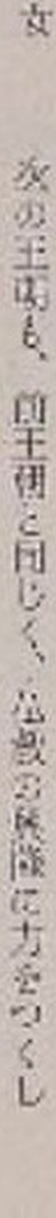次の王朝も、前王朝と同じく、仏教の興隆に力をつくし
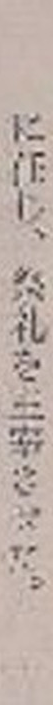に任じ、祭礼を主宰させた。
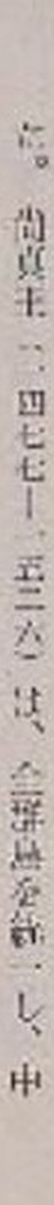た。尚真王(一四七七―一五二六)は、全群島を統一し、中
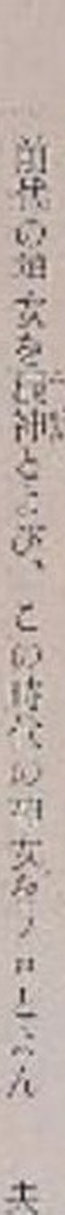前代の神女を根神とよび、この時代の神女をノロとよん
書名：沖縄固有信仰のおとろえ
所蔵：University of the Ryukyus Library
